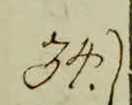34.
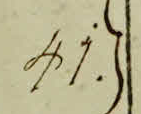41.
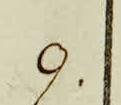9.
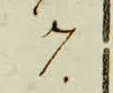7.
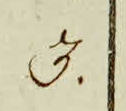3.
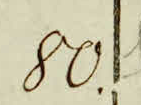80.
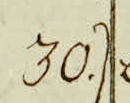30.
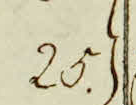25.
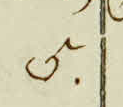5.
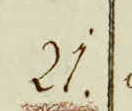21.
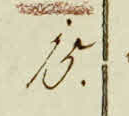15.
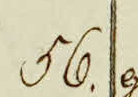56.
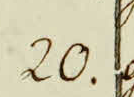20.
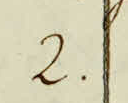2.
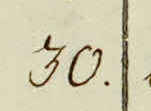30.
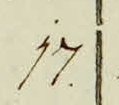17.
